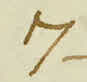7
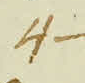4
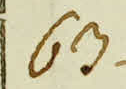63
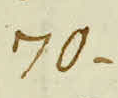70
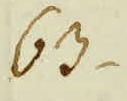63
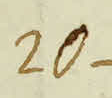20
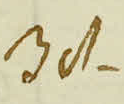38
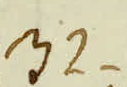32
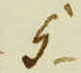5
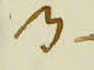3
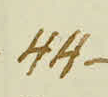44
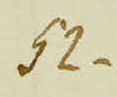52
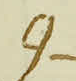9
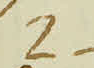2
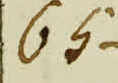65
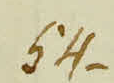54
